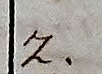2.
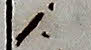1.
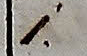1.
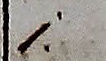1.
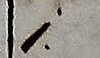1.
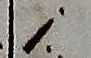1.
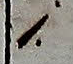1.
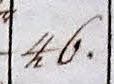46.
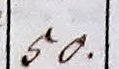50.
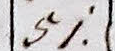51.
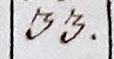33.
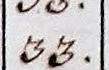33
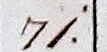71.
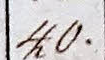40.
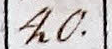40.
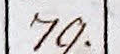79.
